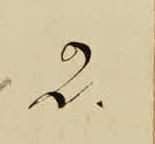2.
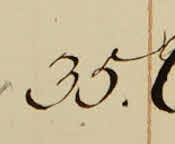35.
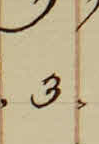3
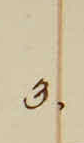3
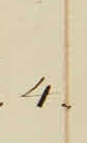4647
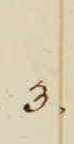3
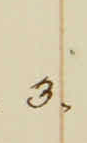3
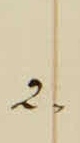2
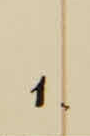1
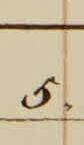5
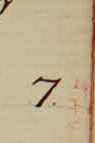7.
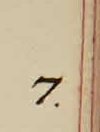7.
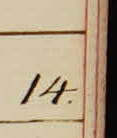14.
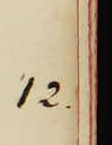12.
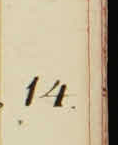14.
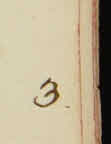3.
